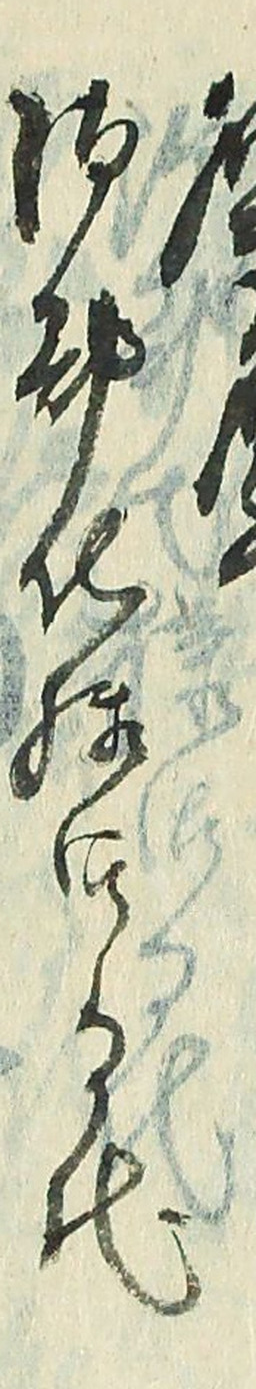御郡代様御手代
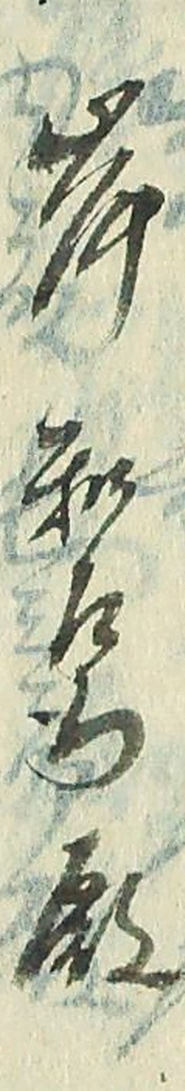岸和左衛門殿
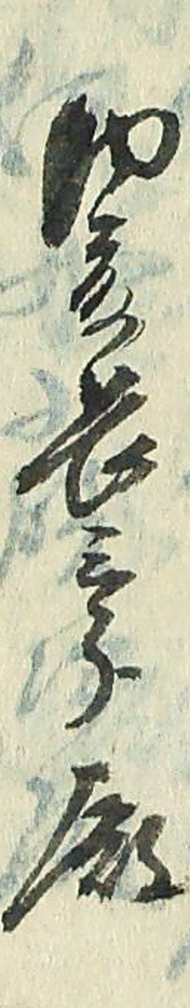内藤長三郎殿
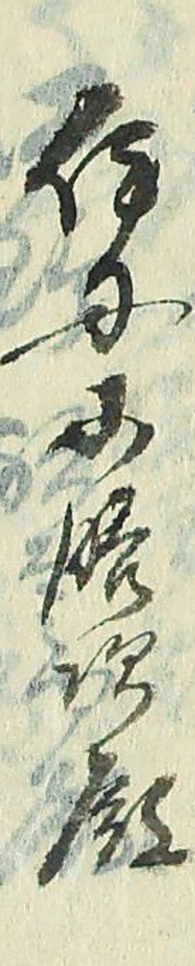伊丹小膳次殿
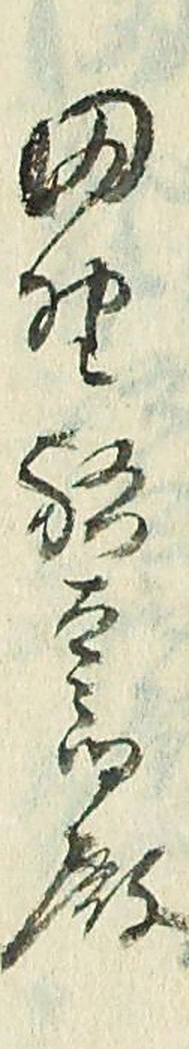田野祐太郎殿

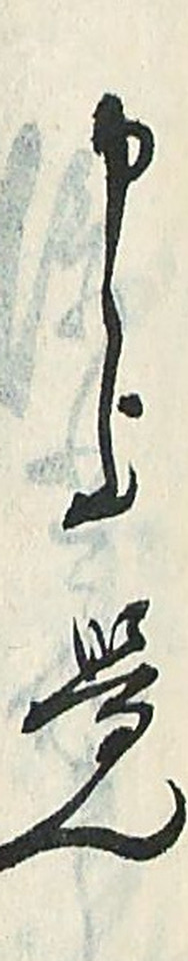申上覚
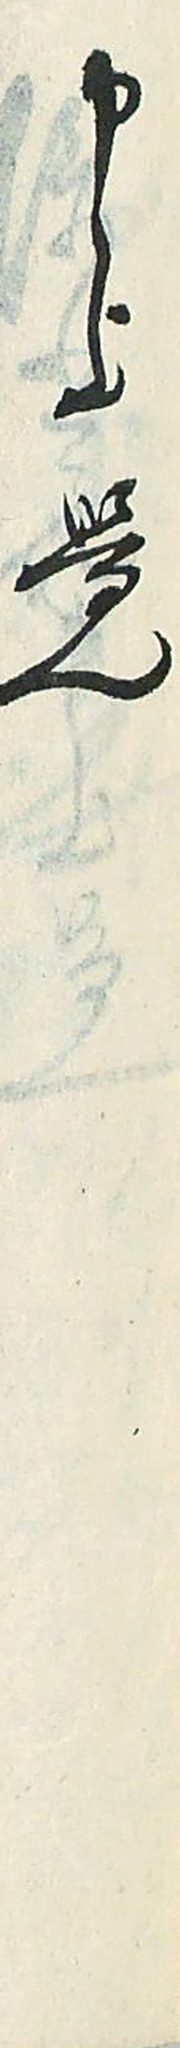申上覚
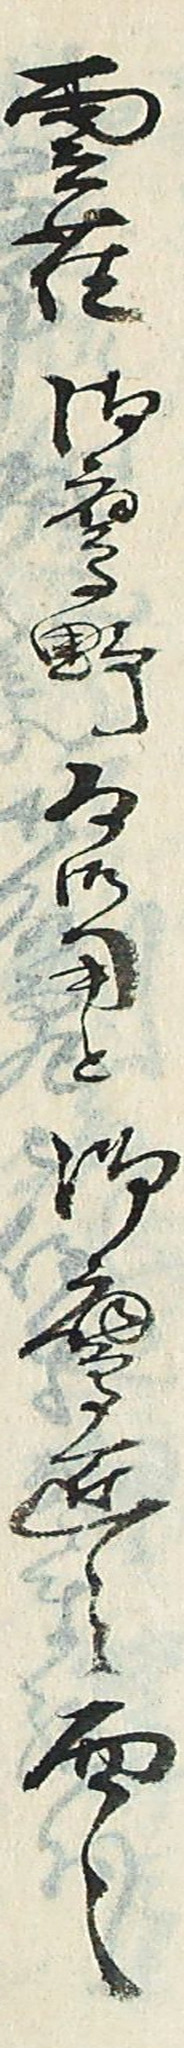雲雀御鷹野為御用と御鷹匠之面々
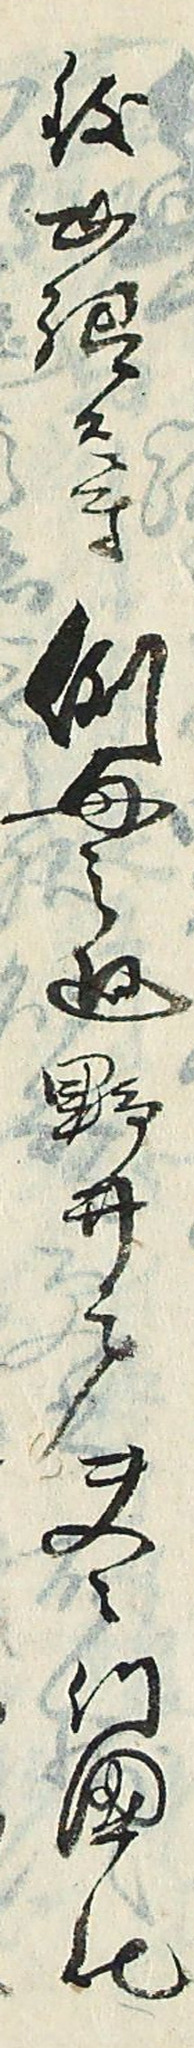致出郷候に付例毎之通野井戸夫々竹囲仕
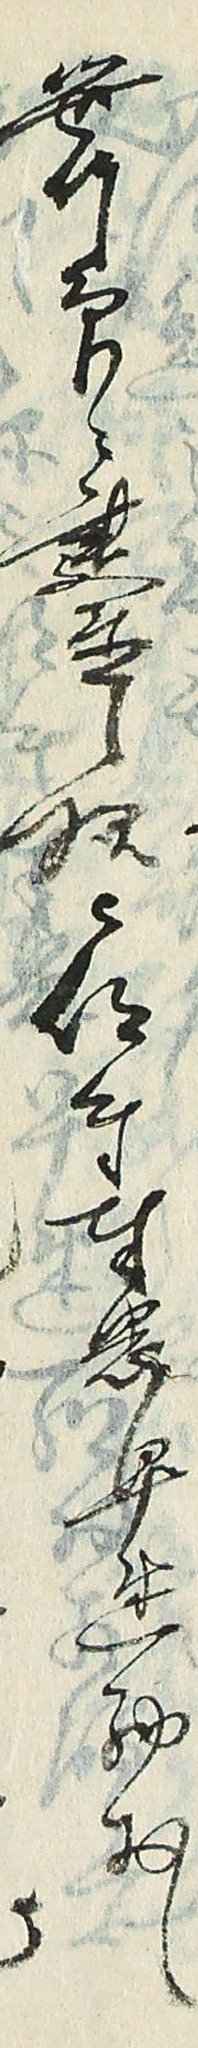笹竹印に建置候様被仰付奉畏早速組村へ
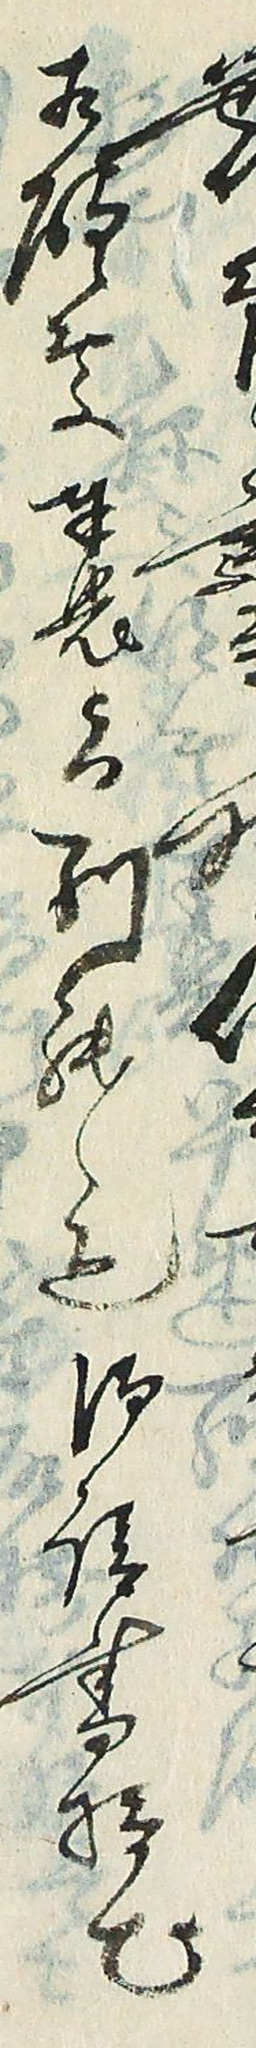相触候所奉畏旨別紙之通御請書指出
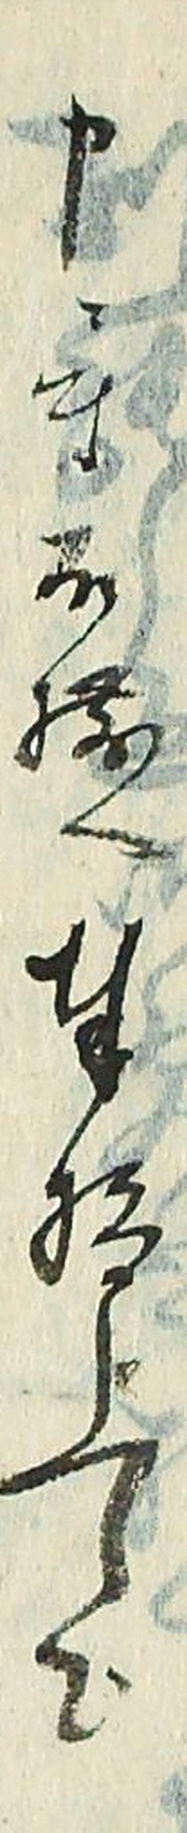申に付取揃へ奉指上候以上
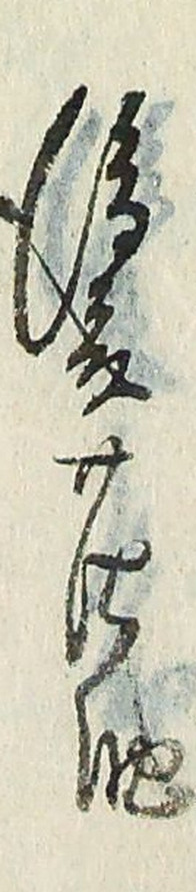後藤荘助
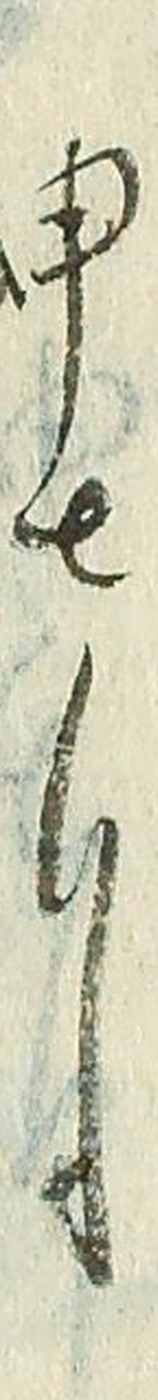申七月
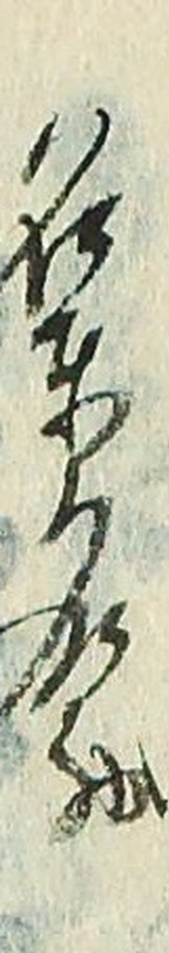名東名西
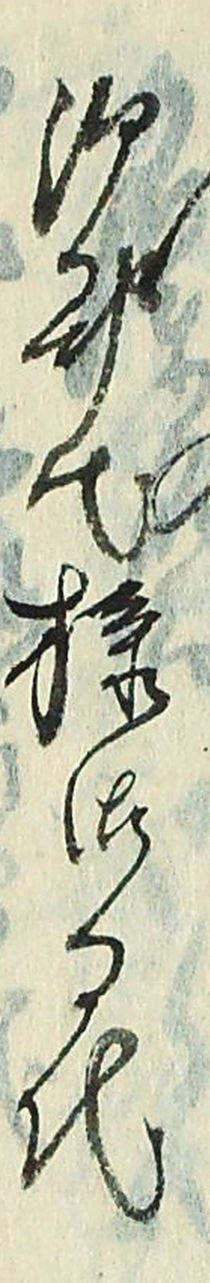御郡代様御手代
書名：諸御用御□受書控
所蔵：鳴門教育大学 Naruto University of Education
